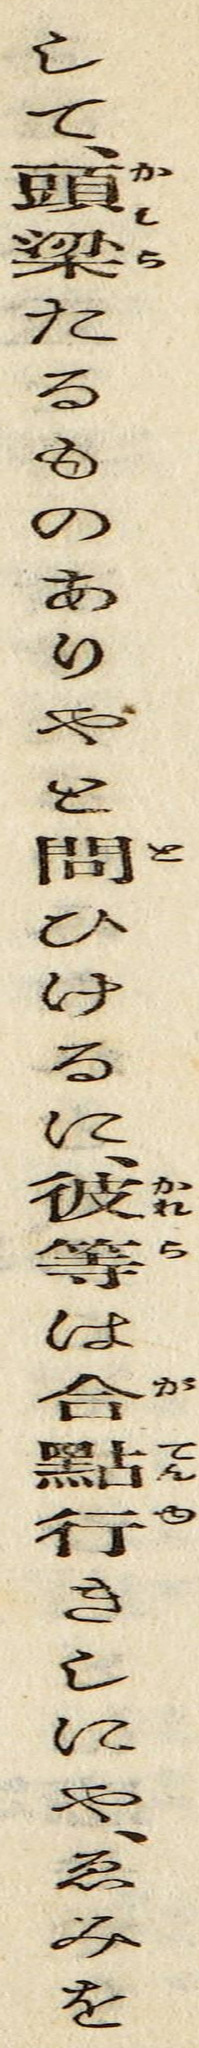して、頭梁たるものありやと問ひけるに、彼等は合点行きしにや、ゑみを
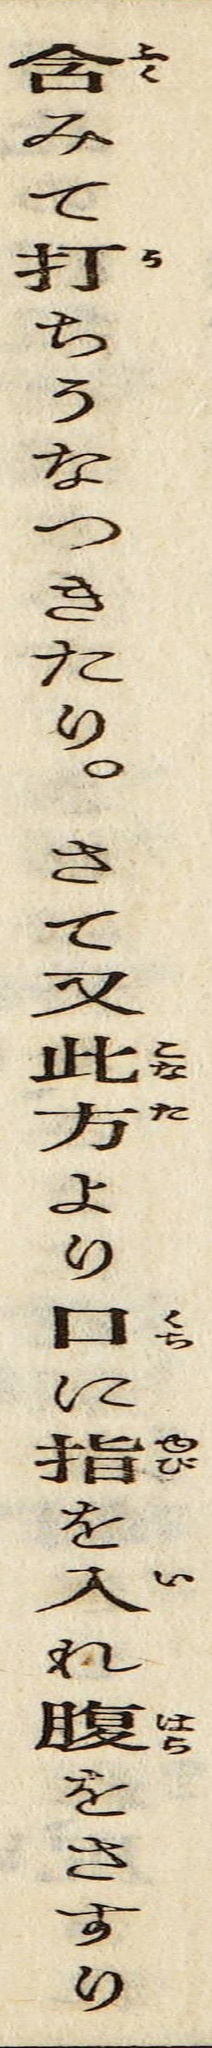含みて打ちうなつきたり。さて又此方より口に指を入れ腹をさすり
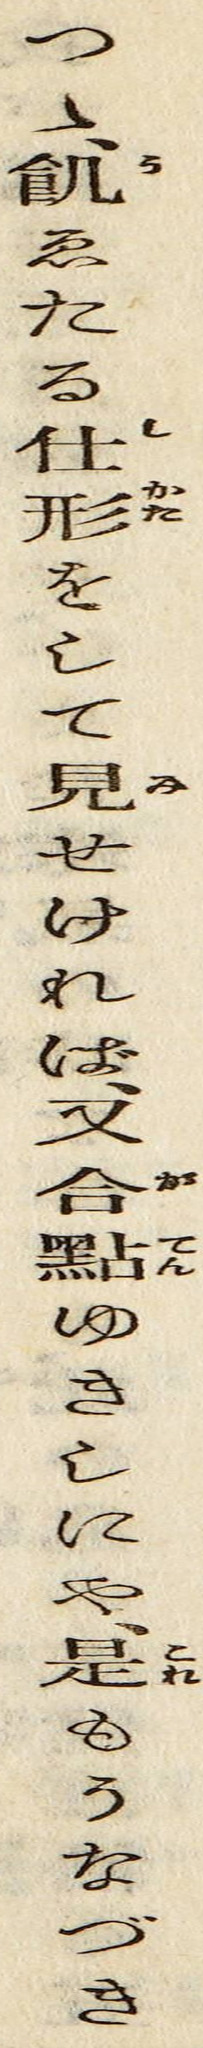つゝ、飢ゑたる仕形をして見せければ、又合点ゆきしにや、是もうなづき
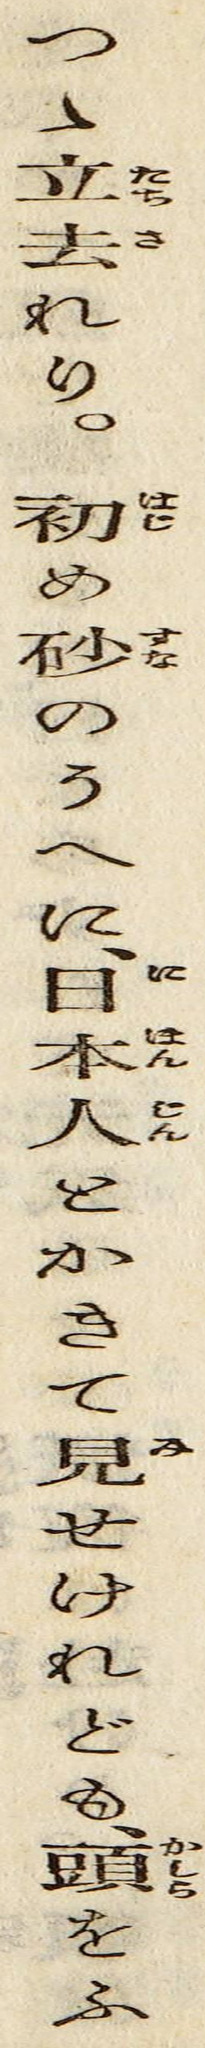つゝ立去れり。初め砂のうへに、日本人とかきて見せけれども、頭をふ
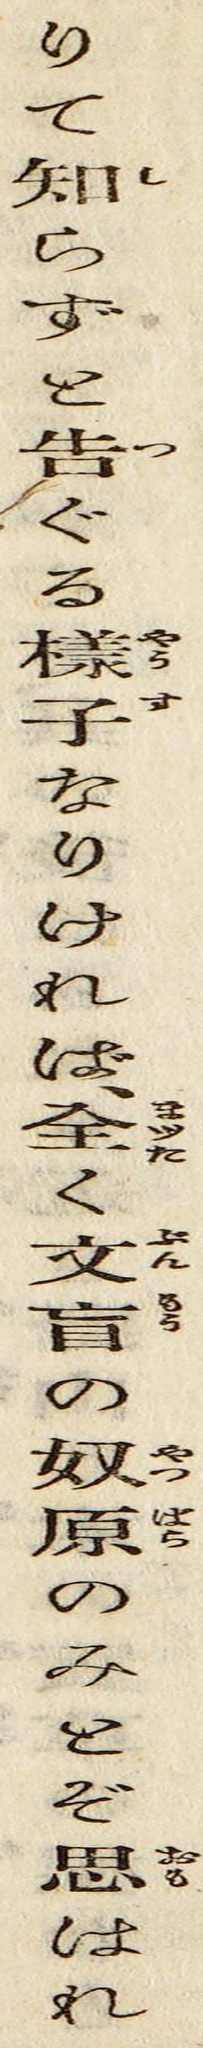りて知らずと告ぐる様子なりければ、全く文盲の奴原のみとぞ思はれ
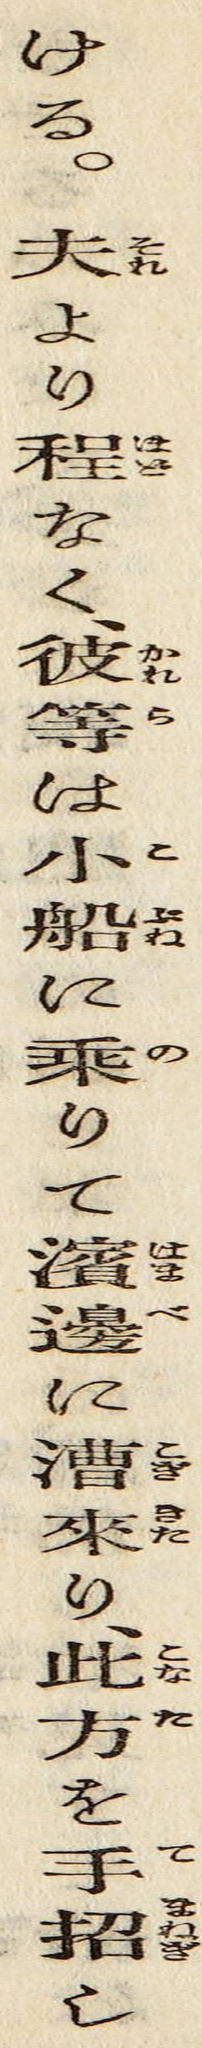ける。夫より程なく、彼等は小船に乗りて浜辺に漕来り、此方を手招し
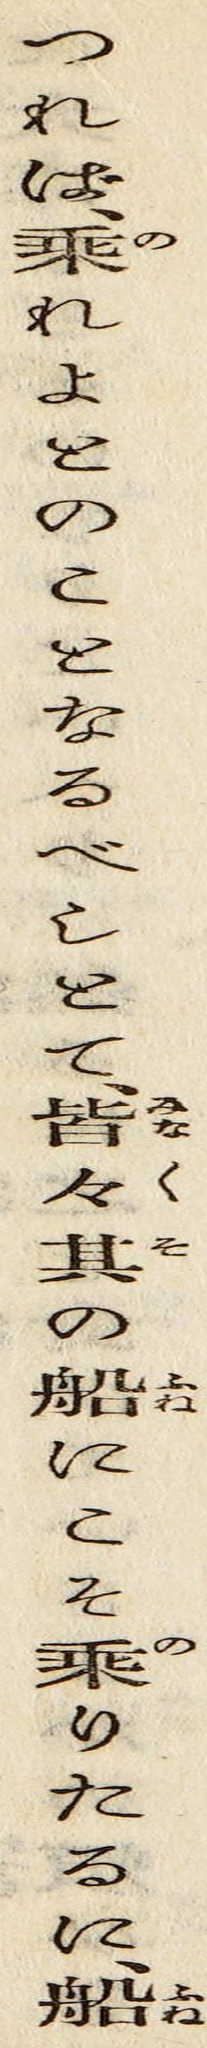つれば、乗れよとのことなるべしとて、皆々其の船にこそ乗りたるに、船
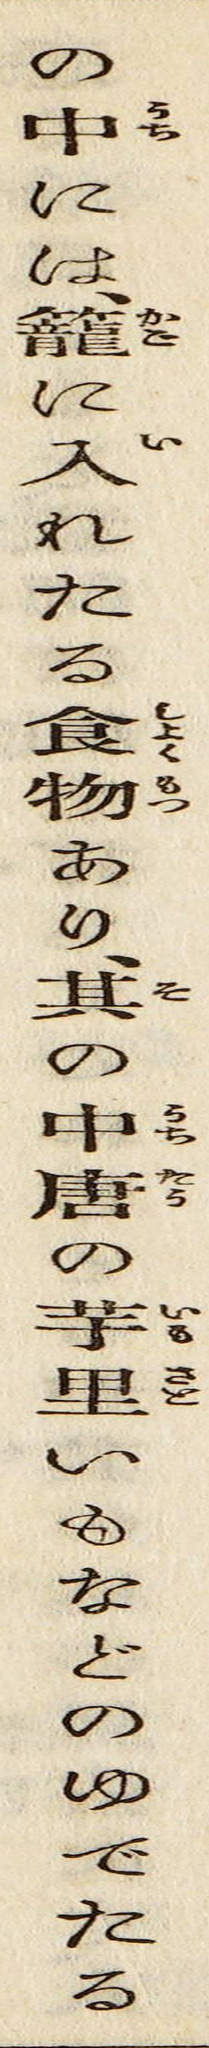の中には、籠に入れたる食物あり、其の中唐の芋里いもなどのゆでたる
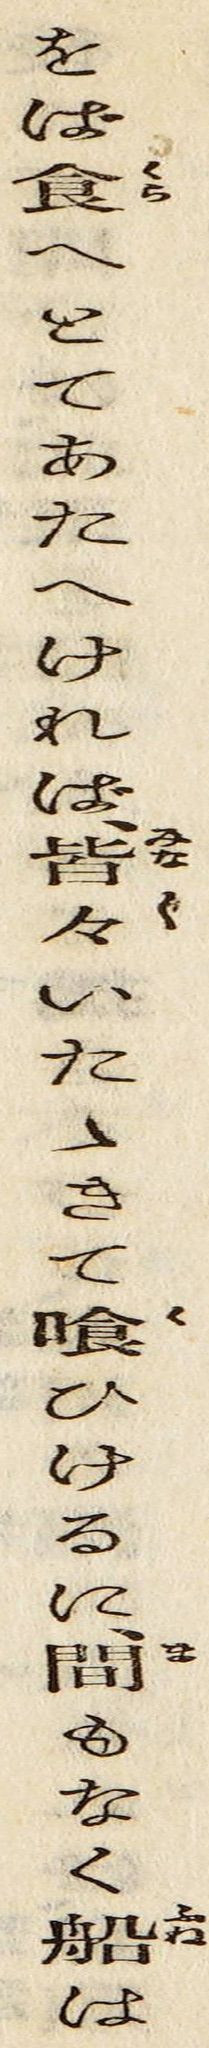をば食へとてあたへければ、皆々いたゝきて喰ひけるに、間もなく船は
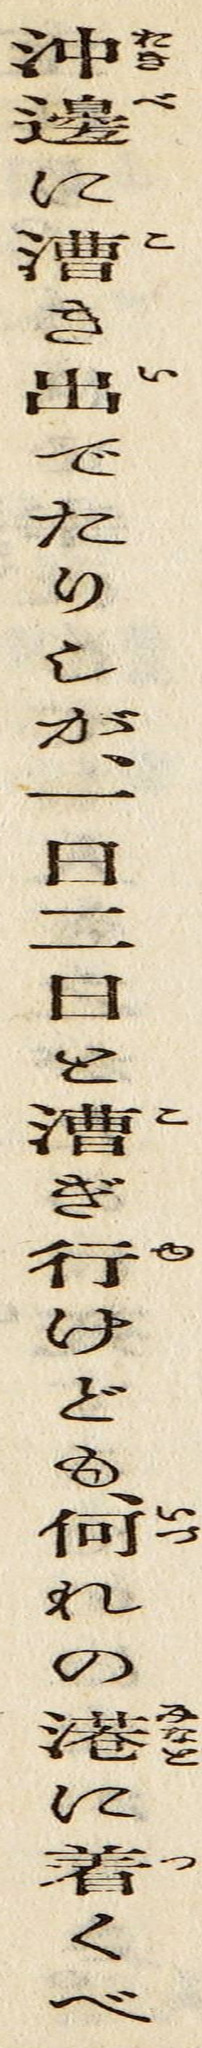沖辺に漕き出でたりしが、一日二日と漕ぎ行けども、何れの港に着くべ
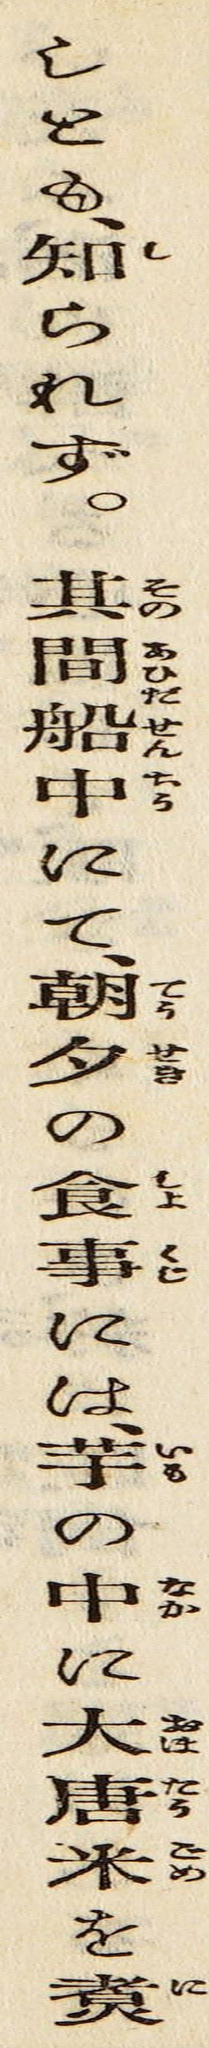しとも、知られず。其間船中にて、朝夕の食事には、芋の中に大唐米を煮
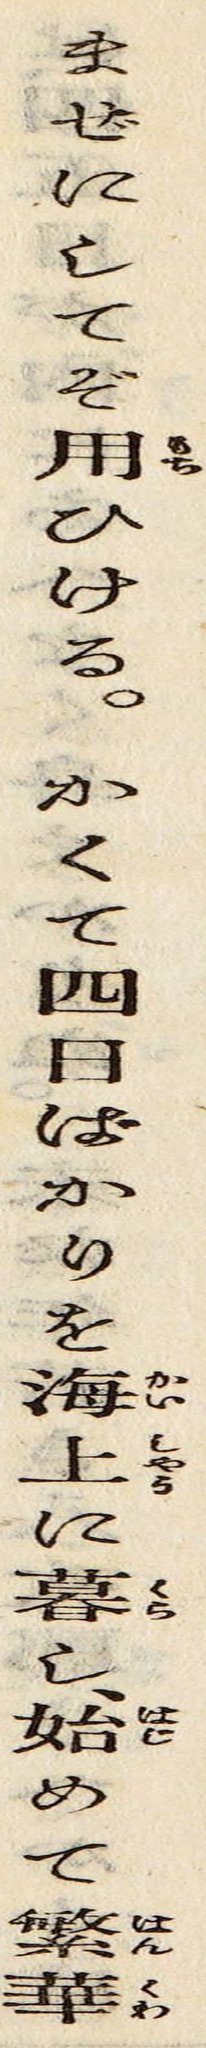まぜにしてぞ用ひける。かくて四日ばかりを海上に暮し、始めて繁華
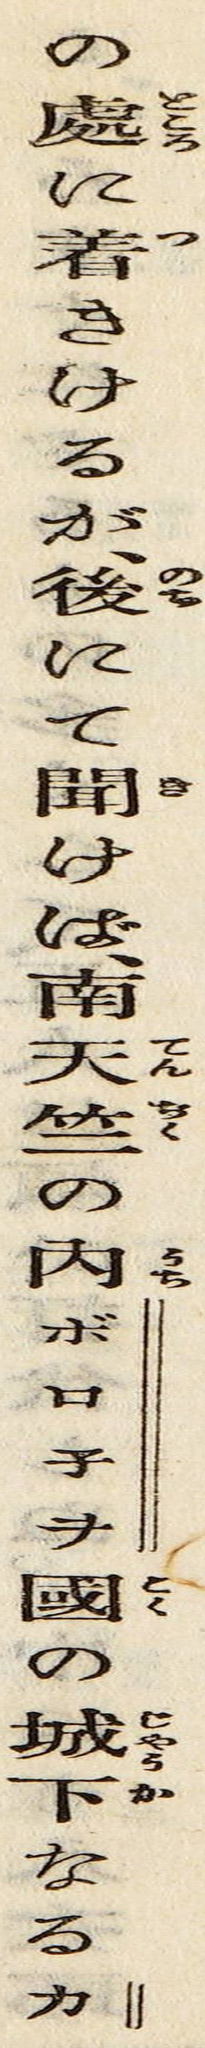の処に着きけるが、後にて聞けば、南天竺の内ボロネヲ国の城下なるカ
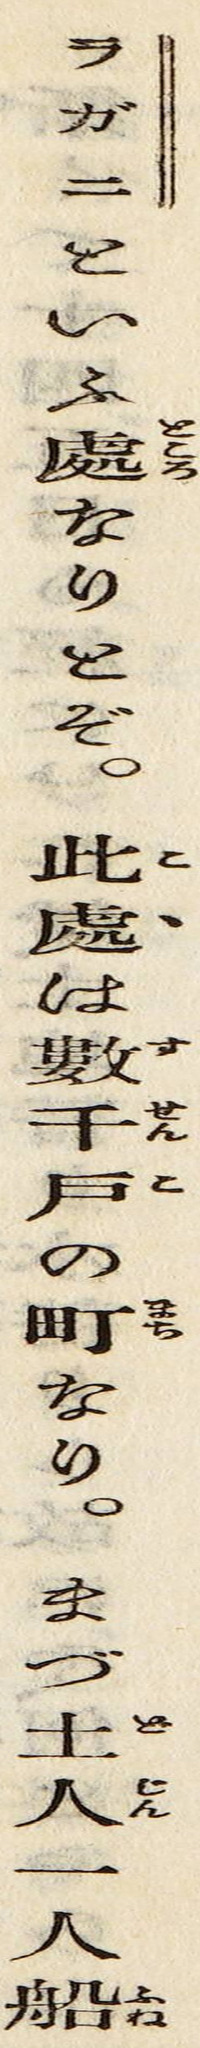ラガニといふ処なりとぞ。此処は数千戸の町なり。まづ土人一人船
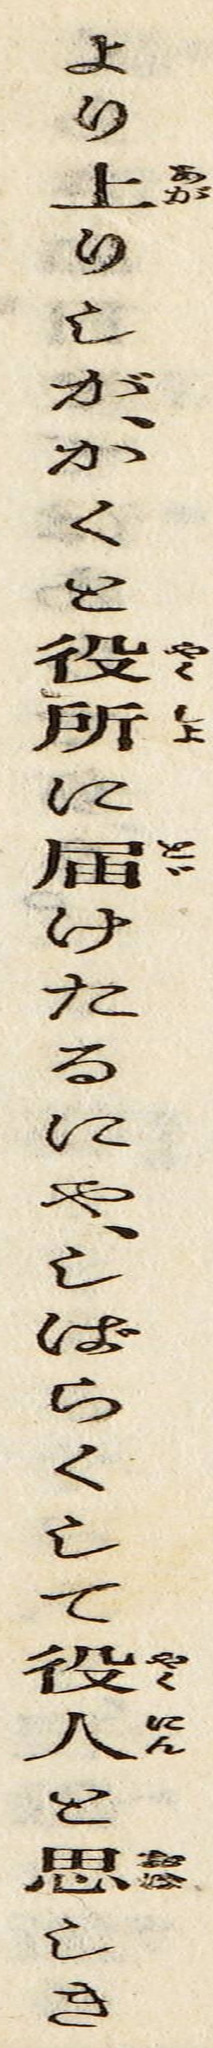より上りしが、かくと役所に届けたるにや、しばらくして役人と思しき
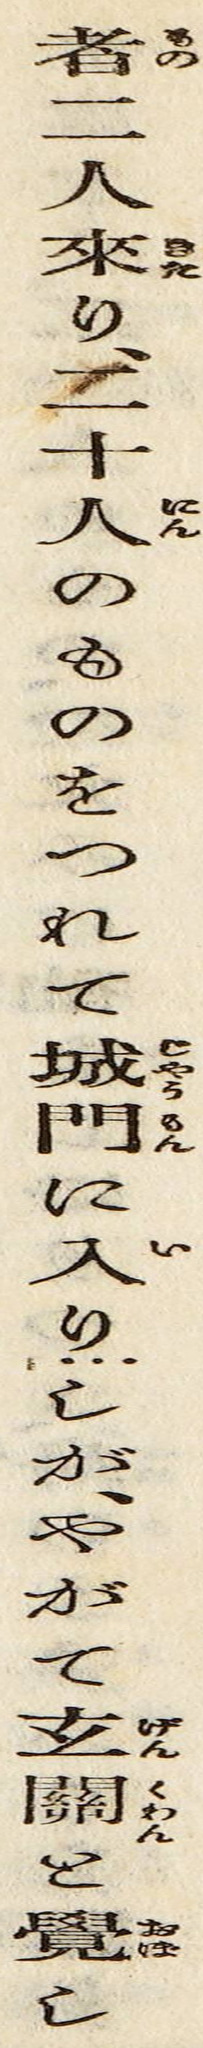者二人来り、二十人のものをつれて城門に入りしが、やがて玄関と覚し
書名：日本漂流譚
